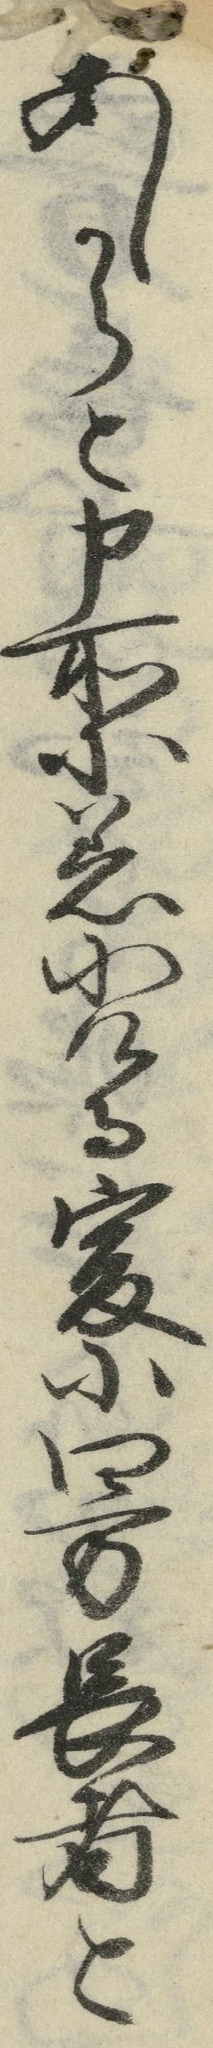あしからと申所に着にける爰に四万長者と
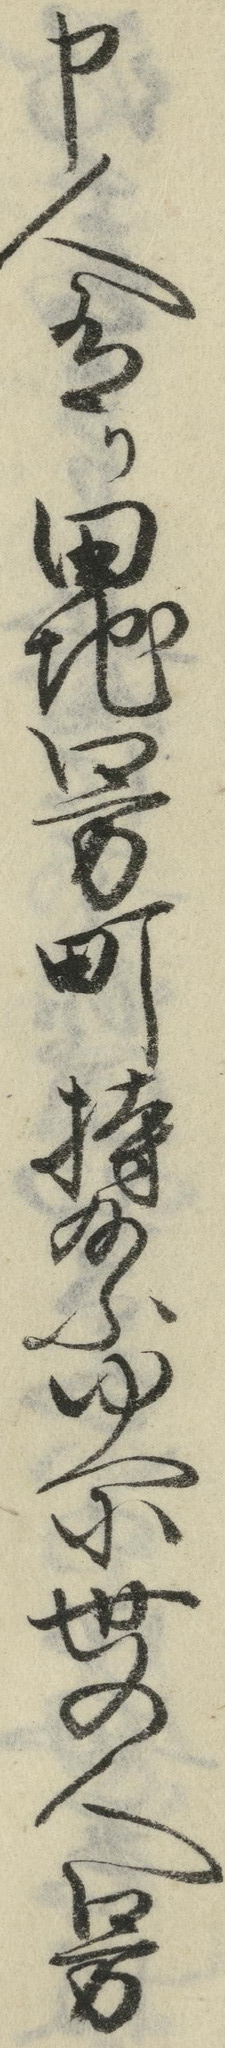申人有リ田地四万町持給ふゆへに世の人四万
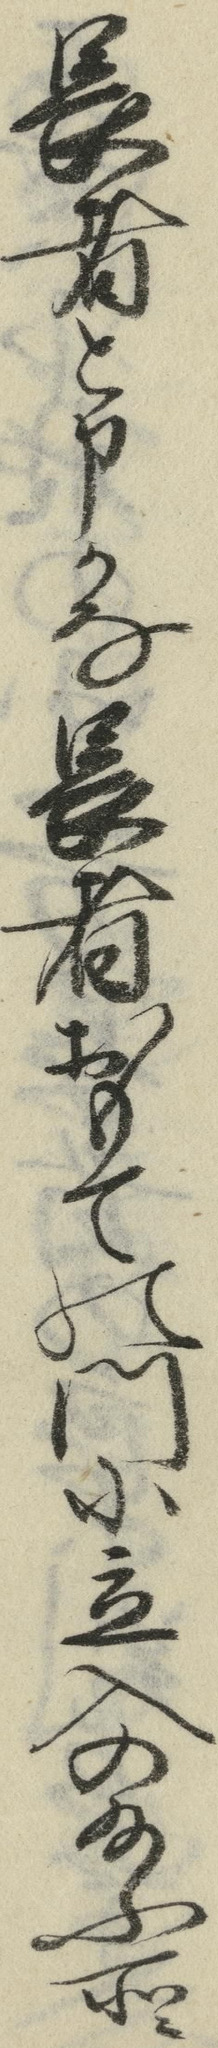長者と申かな長者おもての門に立入の給ふ所
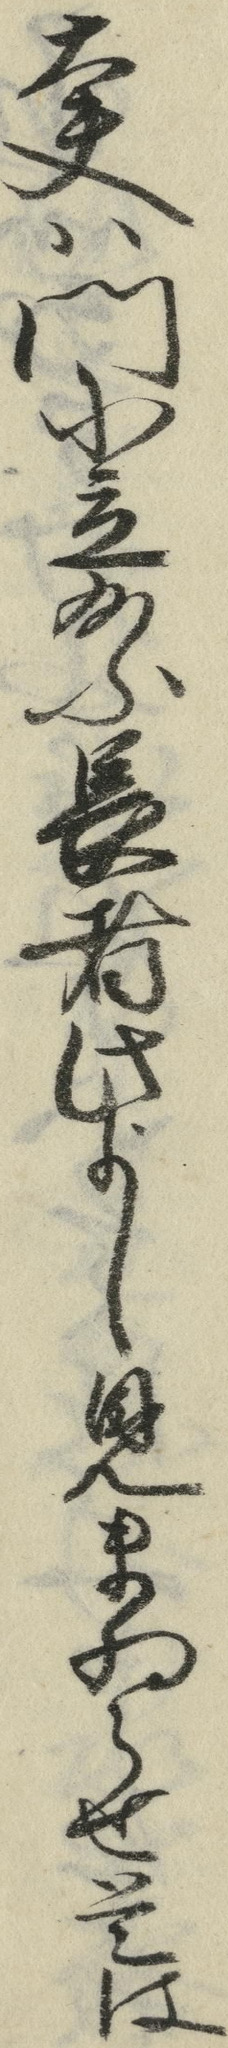大夫ハ門に立給ふ長者此よし見まゐらせ是は
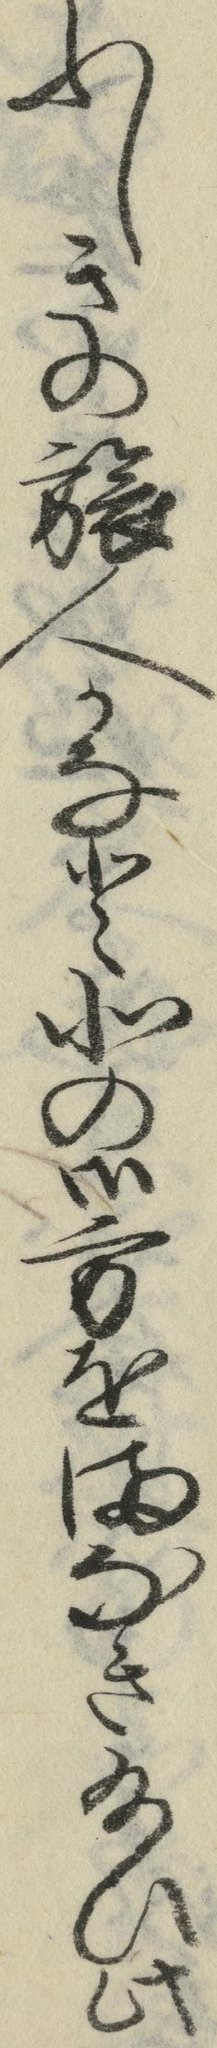ふしきの旅人かなと北の御方をまなき給ひ此
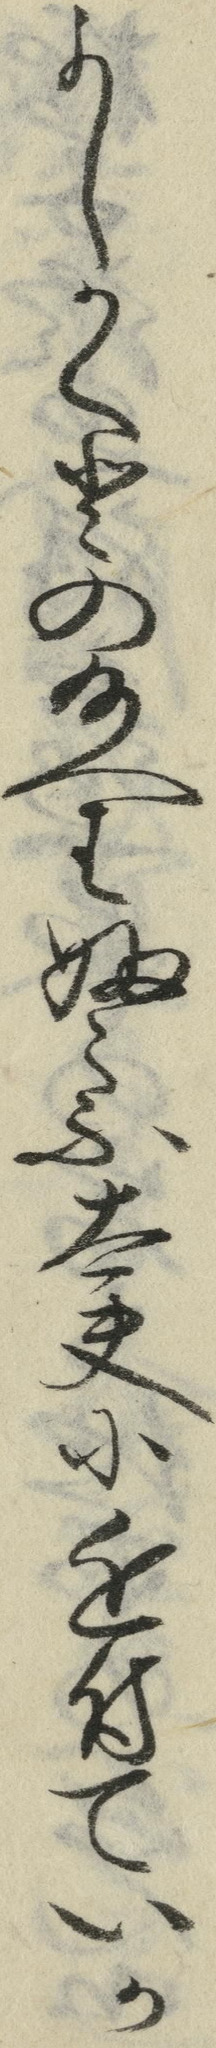よしかくとの給へはふうふ大夫に近付ていか
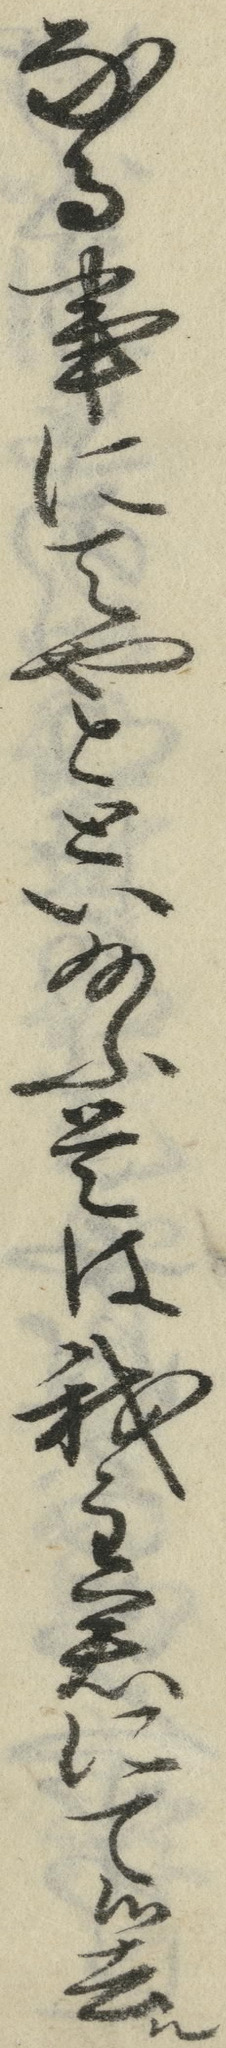なる事にてやととい給ふ是は我主君にて候去
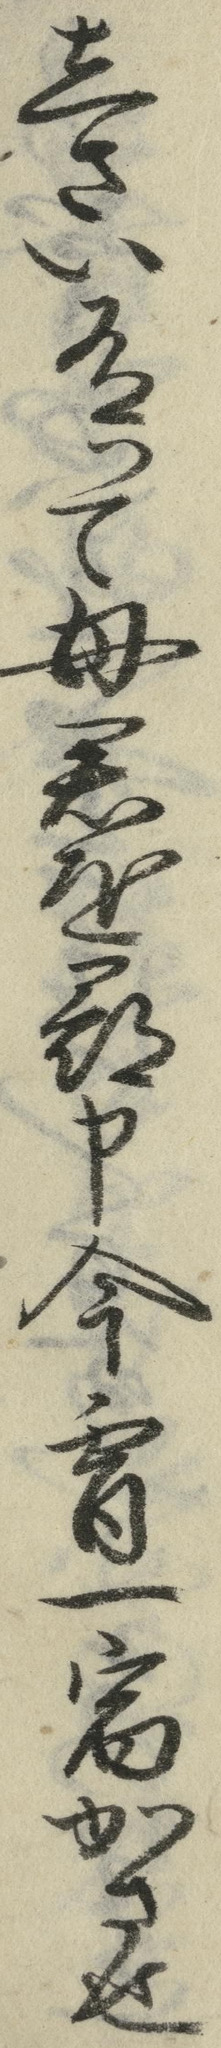しさい有リて母君を尋申今宵一宿かさせ
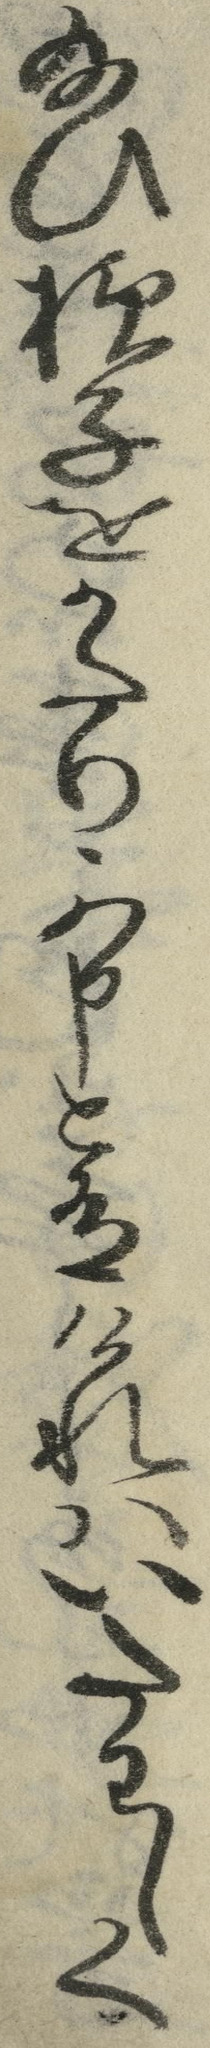給ひ様子をかたり可申と有けれはいたわしく

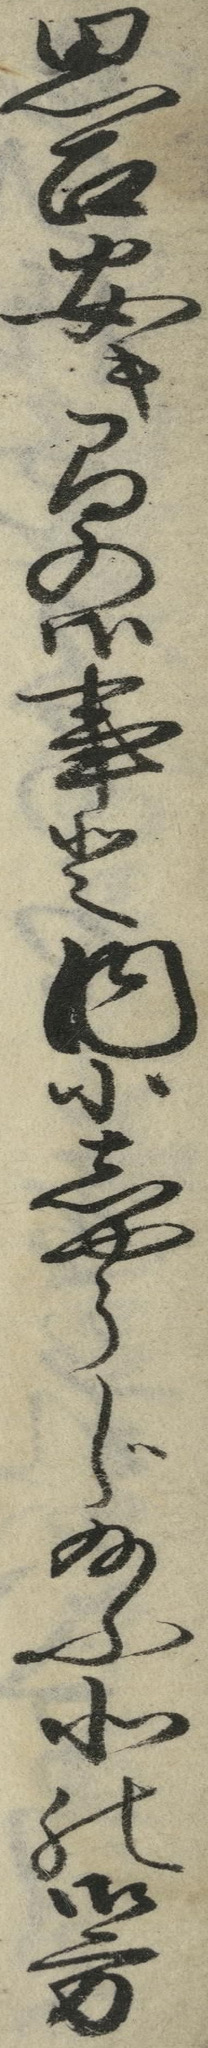思召安間の御事と内にしやうじ給ふ北の御方
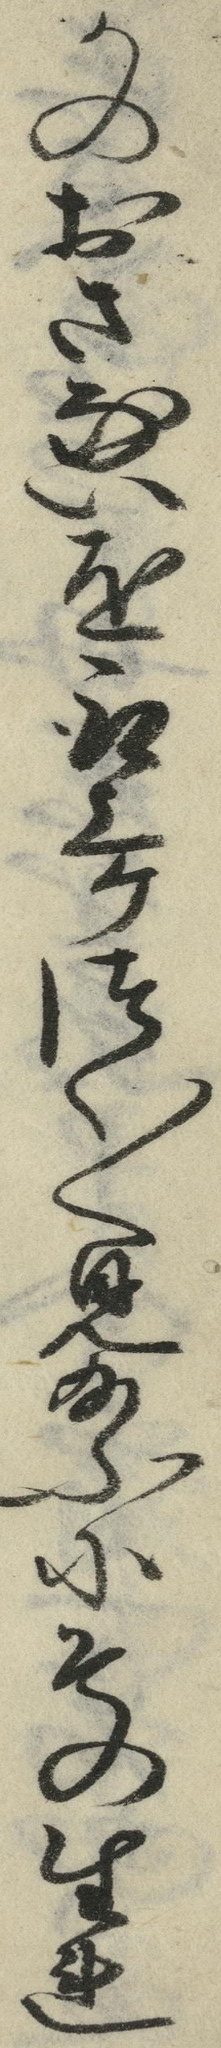かのおさないを取上ケつく〳〵見給ふにその生れ
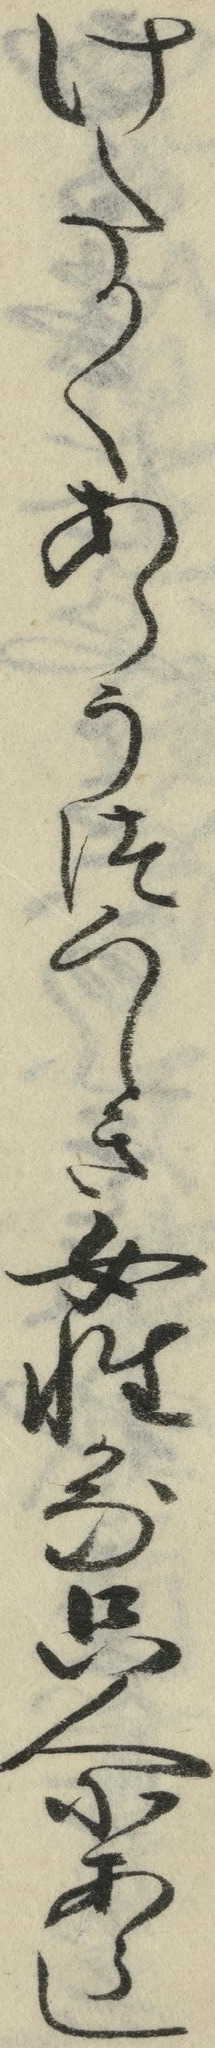けたかくあらうつくしき女性かな只人にあらし
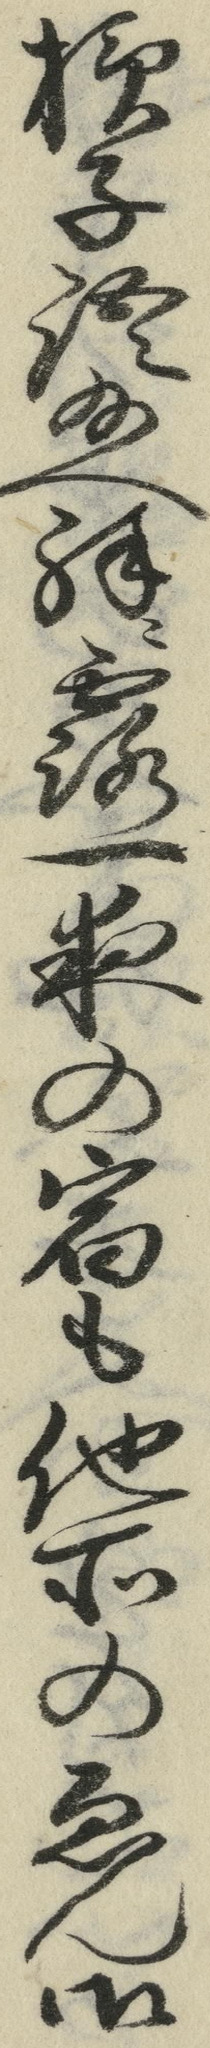様子語給へ殊露一夜の宿も他所のゑん御
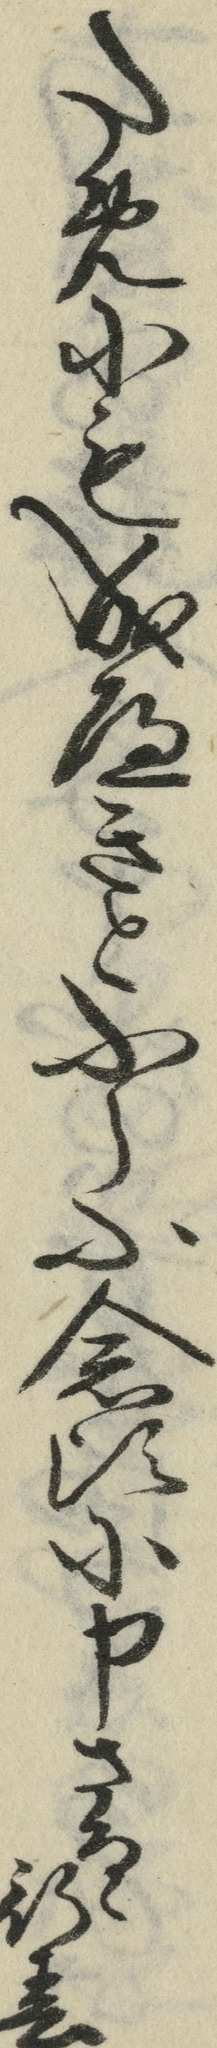ためにも成へきとふうふ念頃に申さるゝ行春
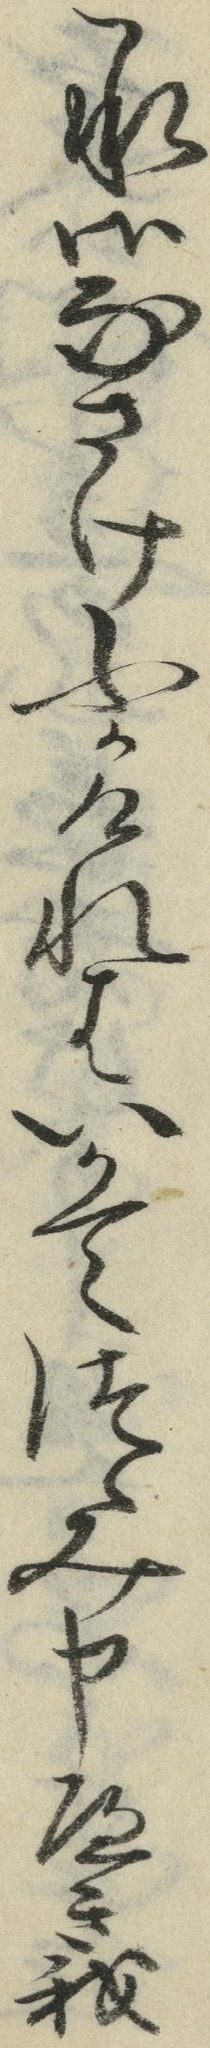承御なさけふかけれはいかてつゝみ申へき我
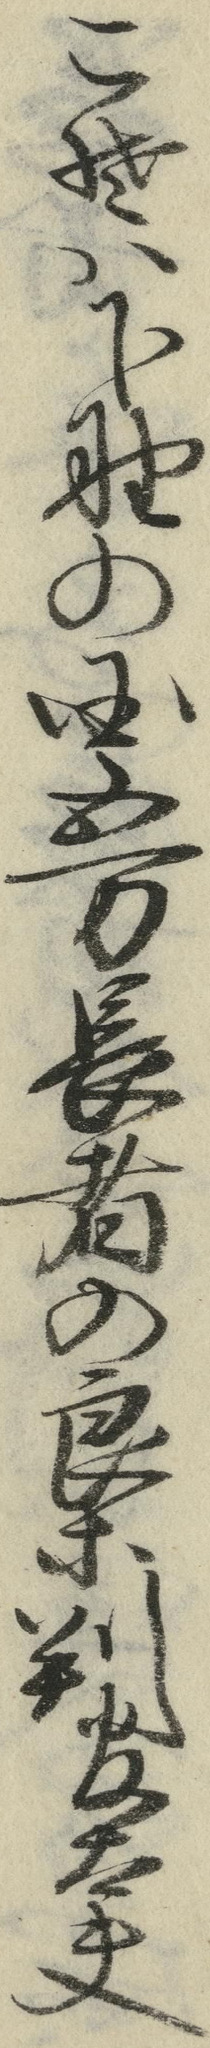こそハ下野の国五万長者の良等判官太夫
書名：浅間記
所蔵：東京大学地震研究所図書室 Earthquake Research Institute Library, The University of Tokyo, JAPAN
